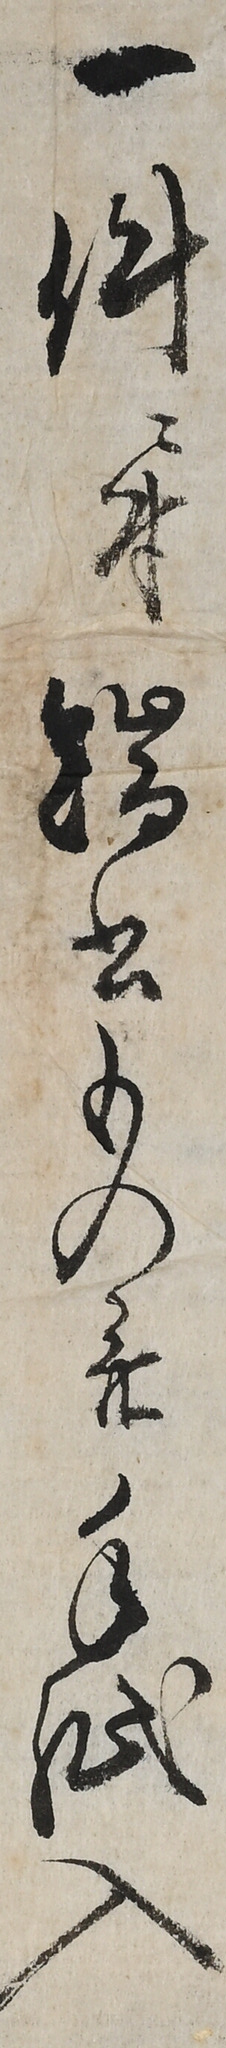一件二付端書もの并手紙入
